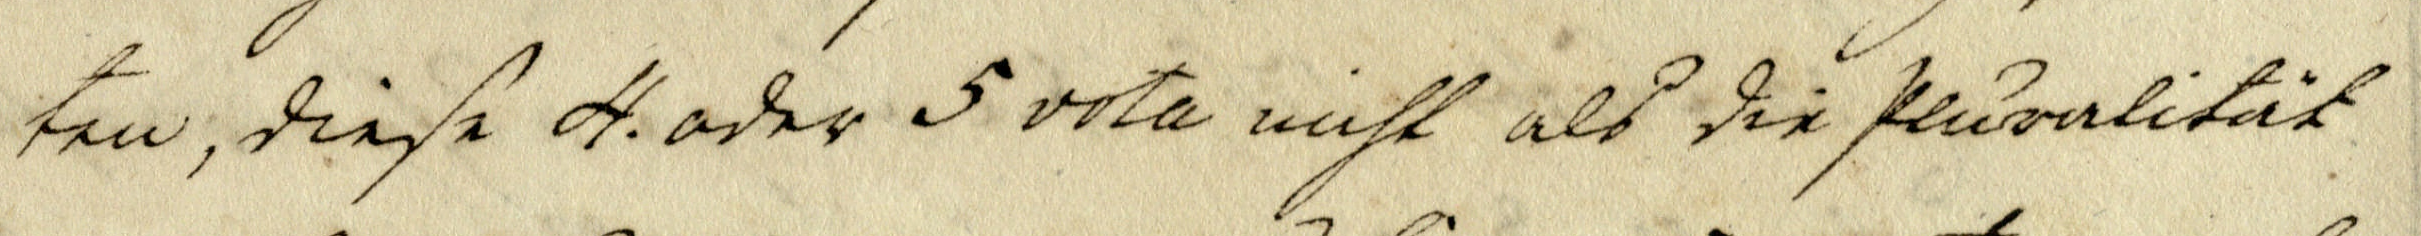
ten, diese 4. oder 5 vota nicht als die Pluralität
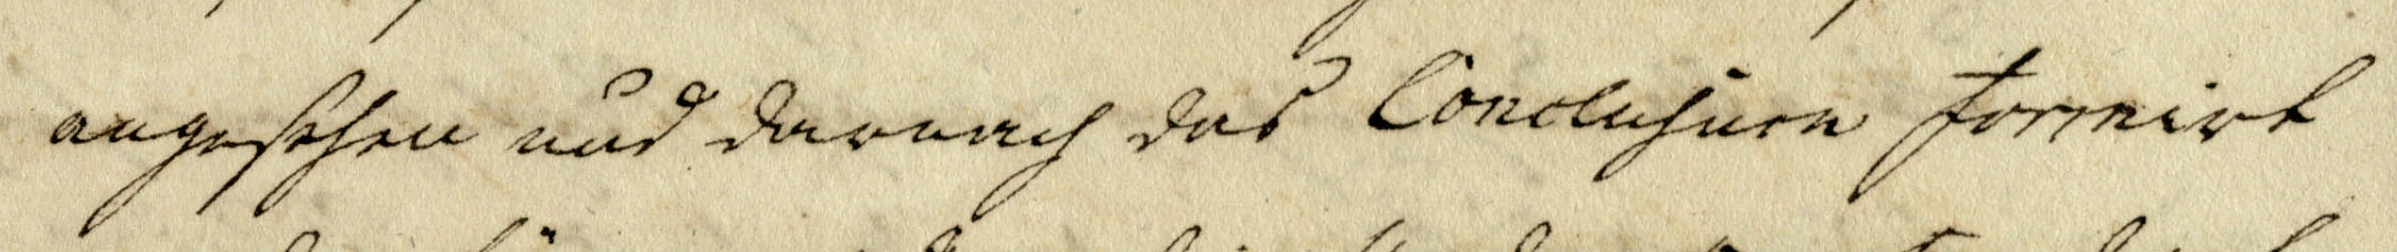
angesehen und darnach das Conclusum formirt
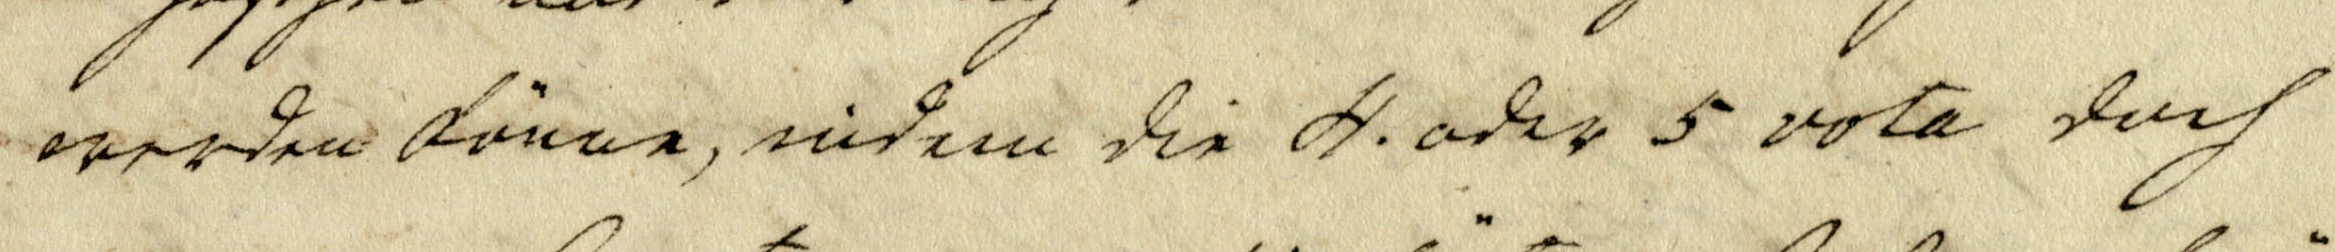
werden könne, indem die 4. oder 5 vota doch
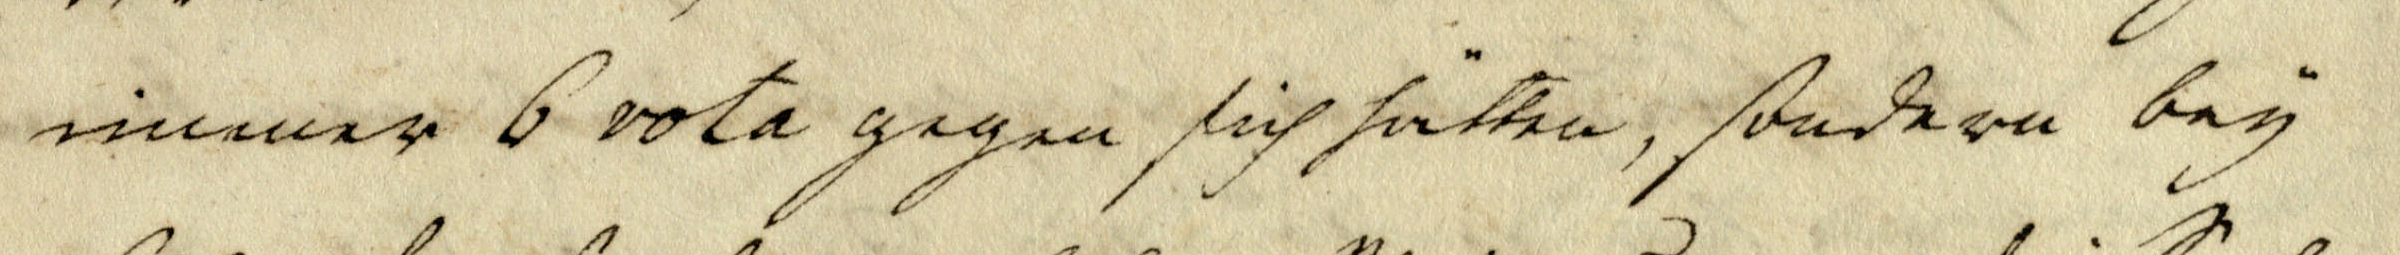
immer 6 vota gegen sich hätten, sondern beÿ
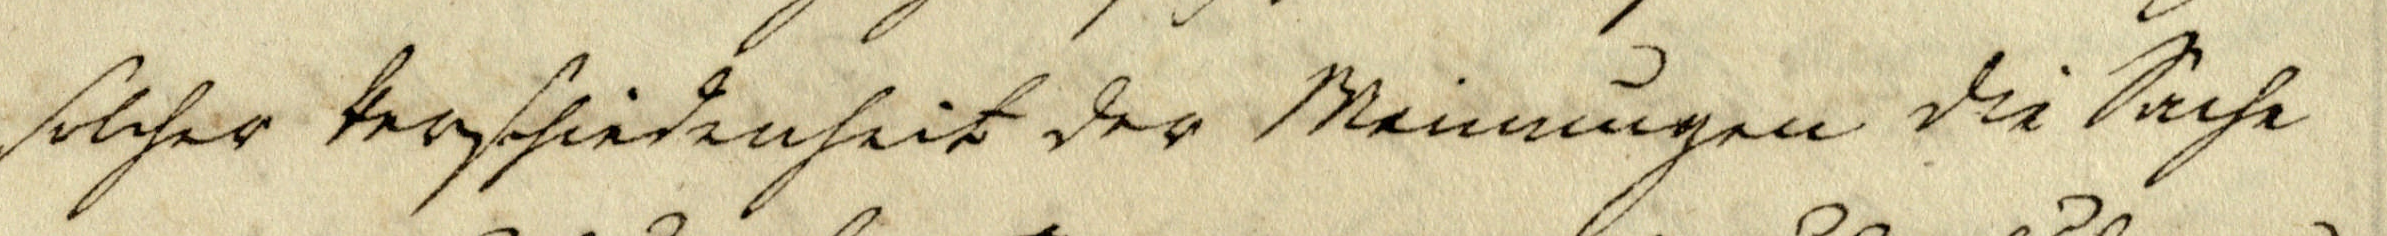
solcher Verschiedenheit der Meinungen die Sache
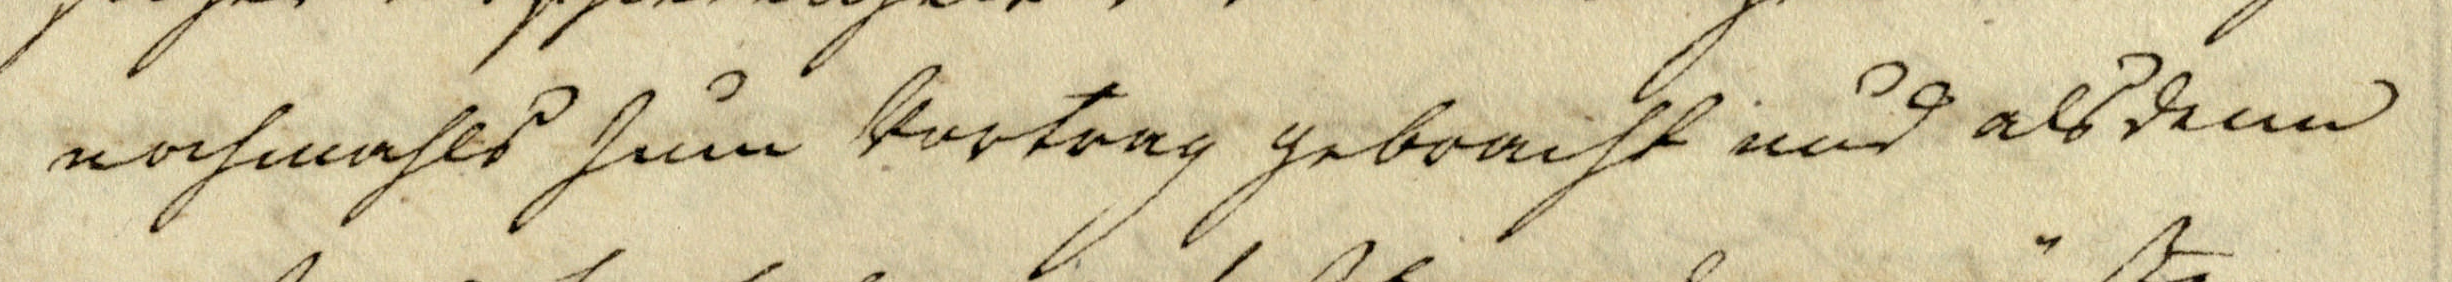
nochmahls zum Vortrag gebracht und als denn
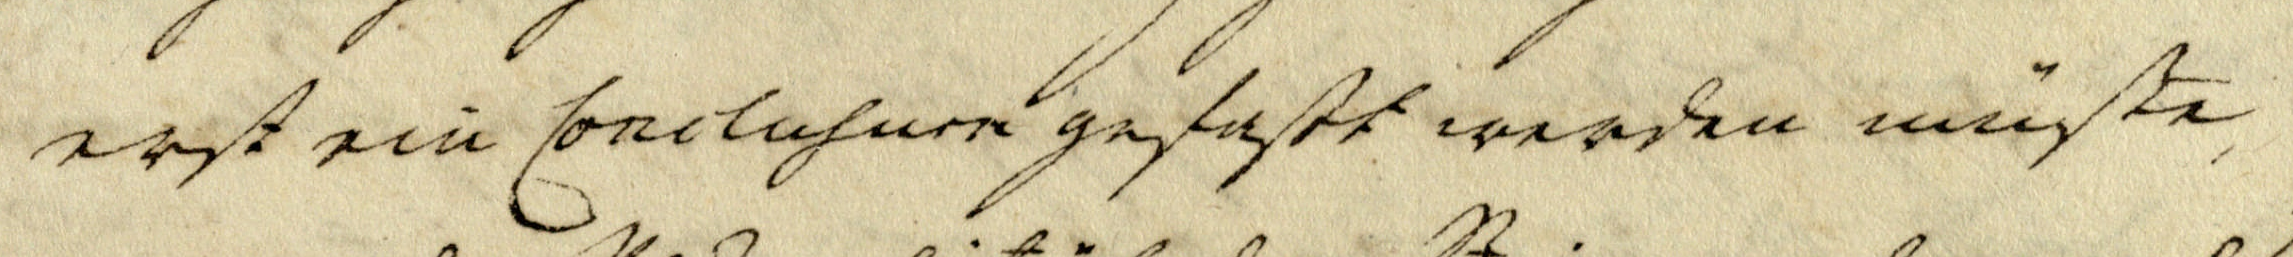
erst ein Conclusum gefaßt werden müßte,
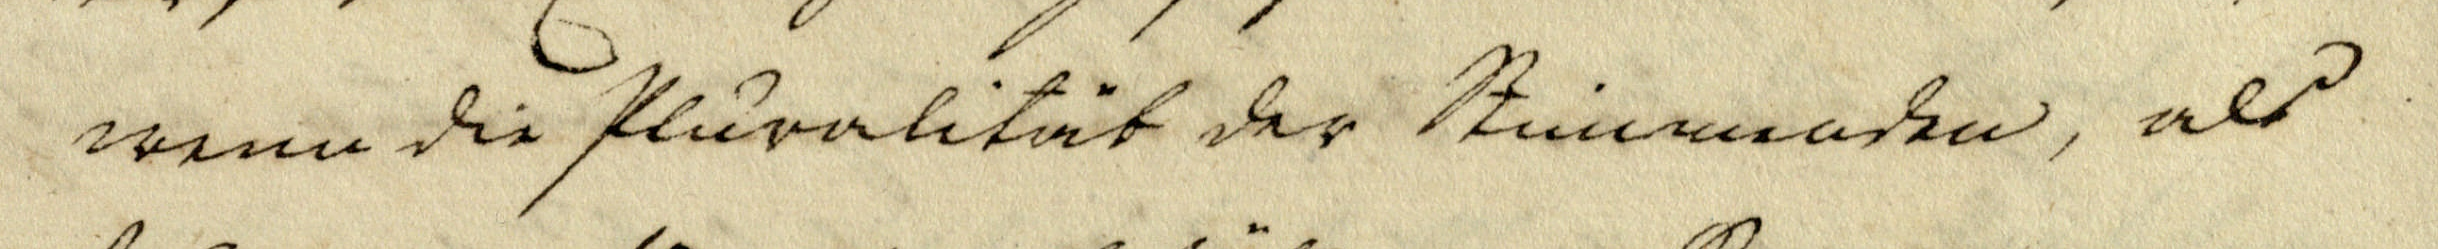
wenn die Pluralität der Stimmenden, als
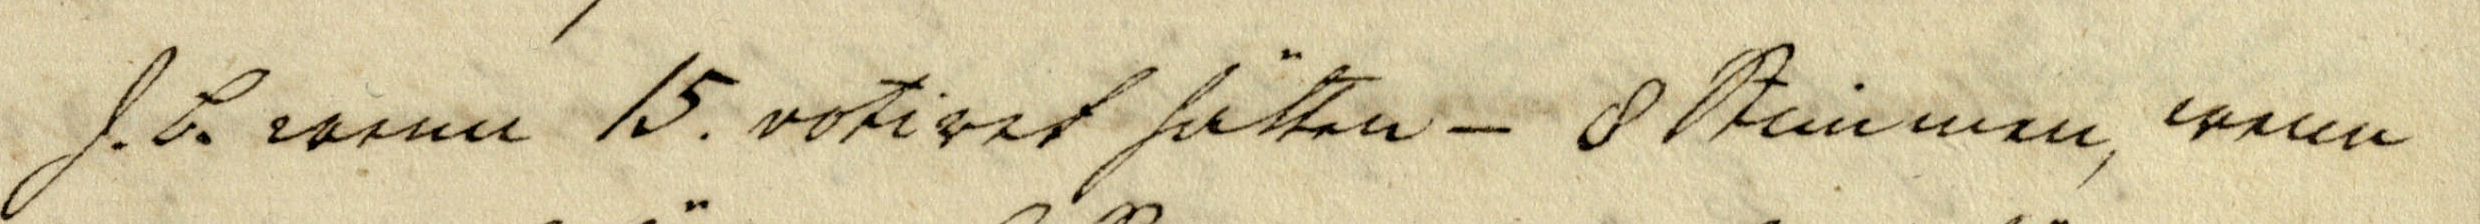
z. B. wenn 15. votiret hätten 8 Stimmen, wenn
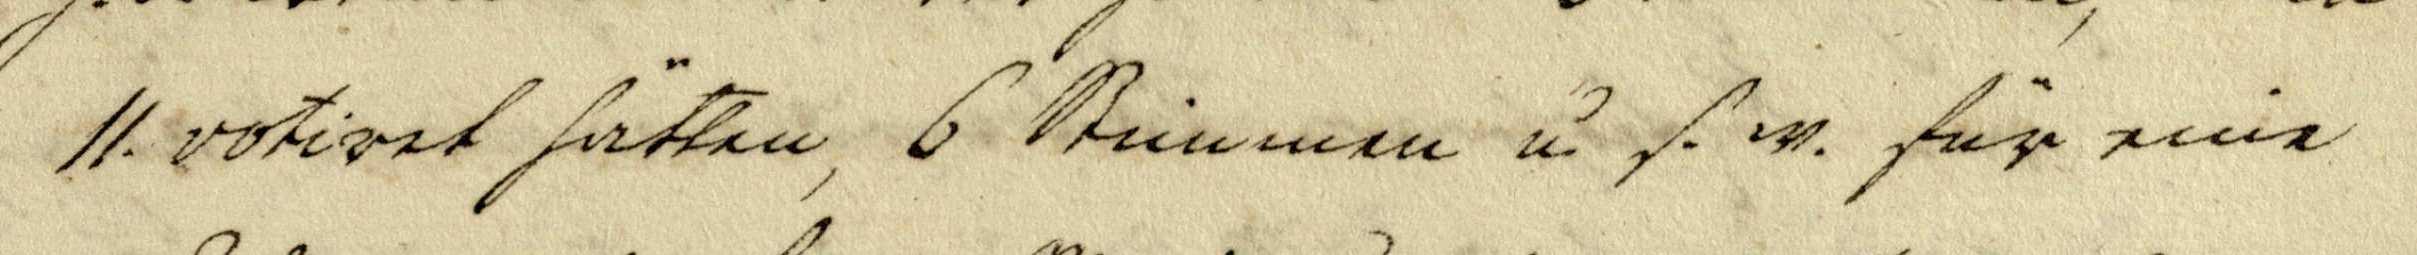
11. votirt hätten 6 Stimmen u. s. w. für eine
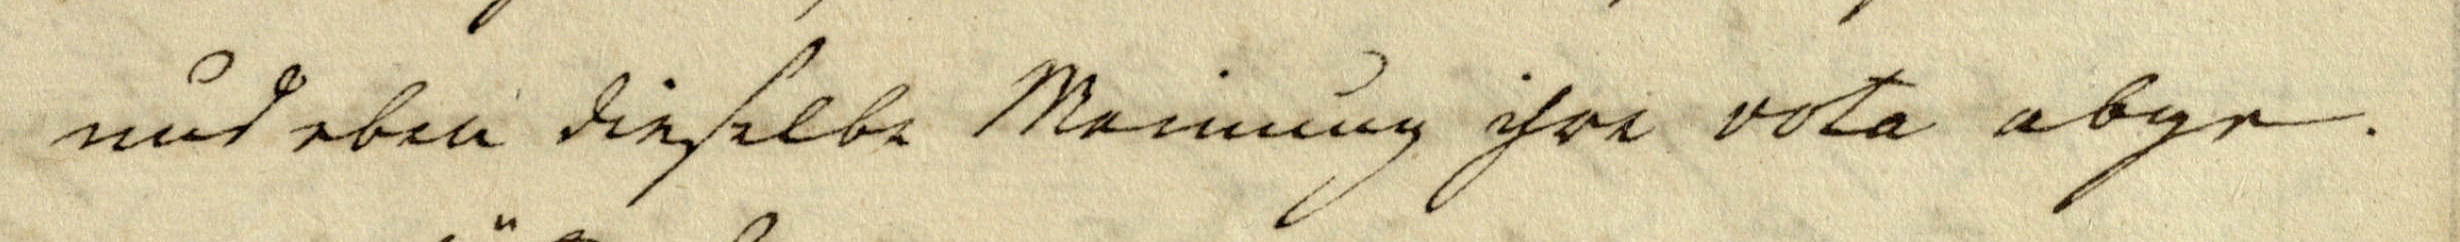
und eben dieselbe Meinung ihre vota abge¬
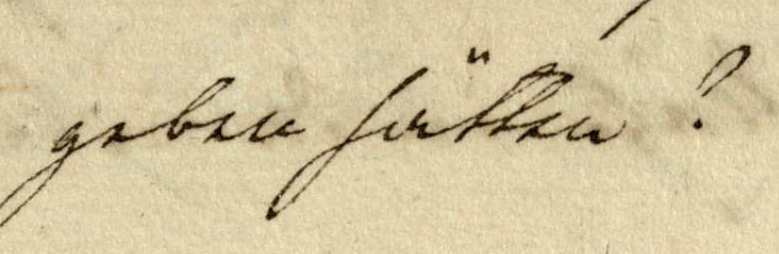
geben hätten?
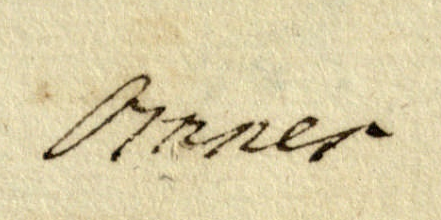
Omnes
